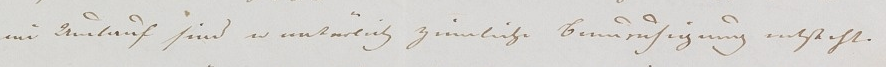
im Umlauf sind u natürlich ziemliche Beunruhigung entsteht.
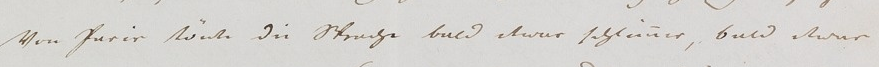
Von Paris tönte die Sprache bald etwas schlimmer, bald etwas
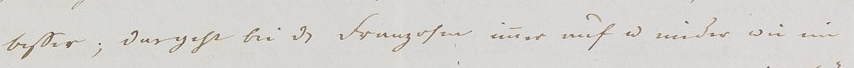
besser; das geht bei den Franzosen immer auf u nieder wie ein
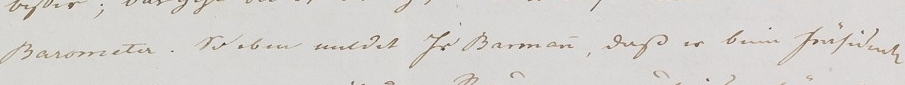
Barometer. So eben meldet Hr Barmann, daß er beim Präsidenten
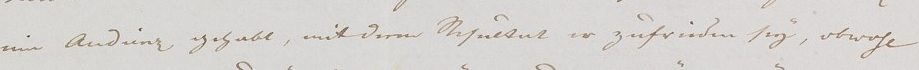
eine Audienz gehabt, mit deren Resultat er zufrieden sey, obwohl
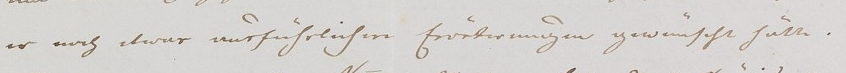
er noch etwas ausführlichere Erörterungen gewünscht hätte.
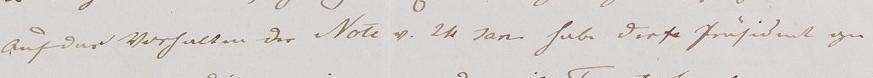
Auf das Vorhalten der Note v. 24 Jan. habe der se Präsident ge-
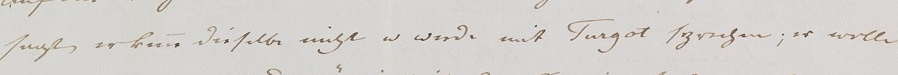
sagt, er kenne dieselbe nicht u werde mit Turgot sprechen; er wolle
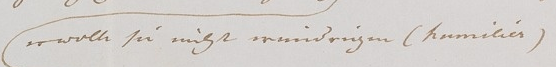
er wolle sie nicht erniedrigen (humilier),
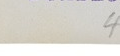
verlange
